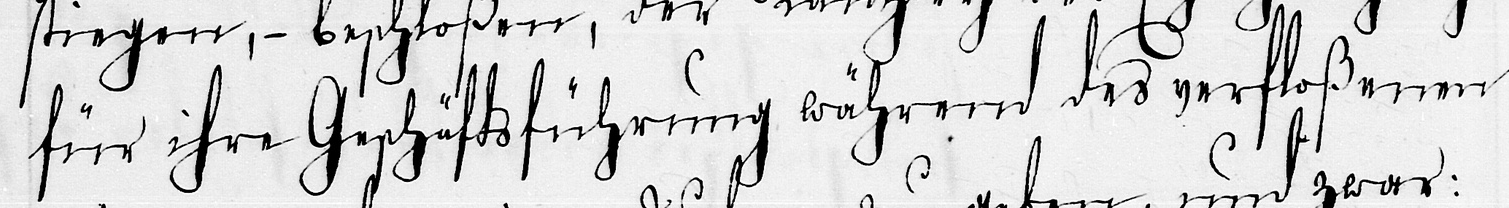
für ihre Geschäftsführung während des verfloßenen
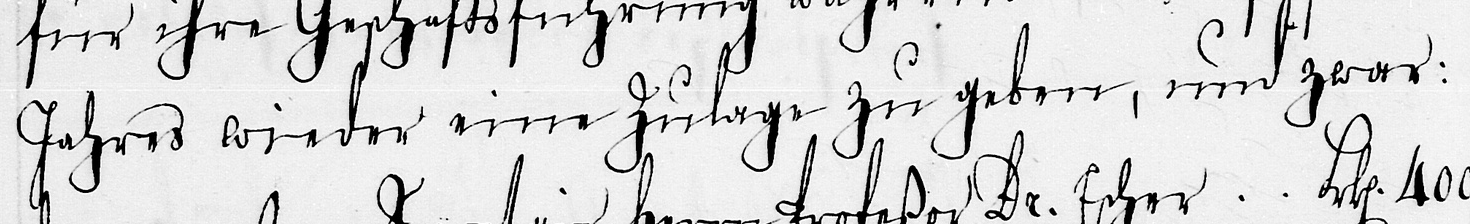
Jahres wieder eine Zulage zu geben, und zwar:
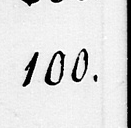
100.
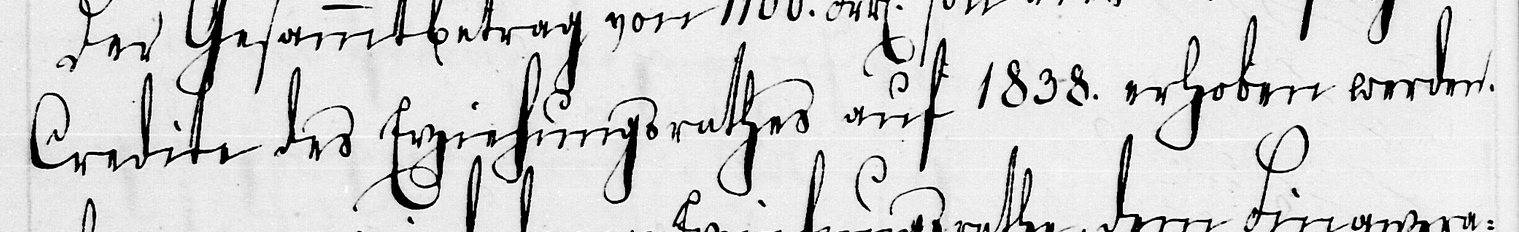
Credite des Erziehungsrathes auf 1838. erhoben werden.
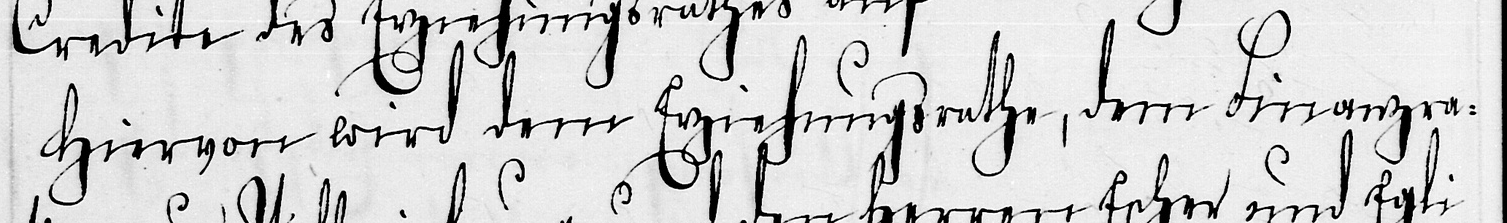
Hiervon wird dem Erziehungsrathe, dem Finanzra¬
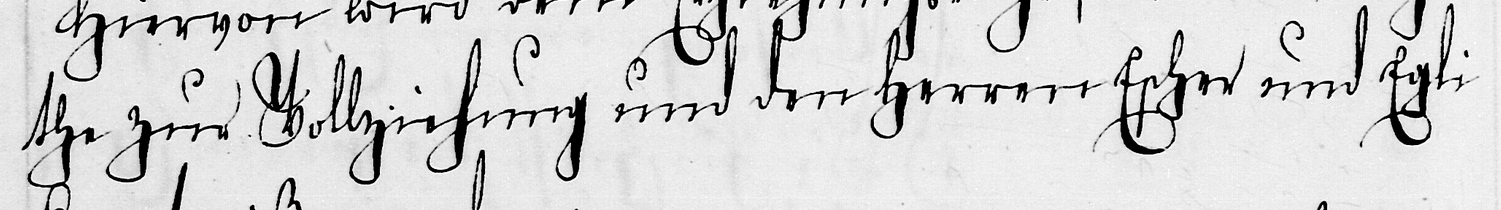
the zur Vollziehung und den Herren Escher und Egli
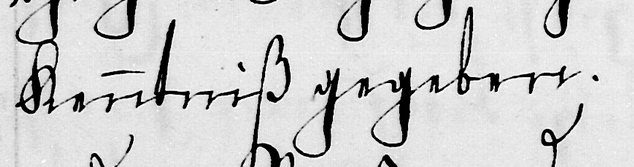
Kenntniß gegeben.
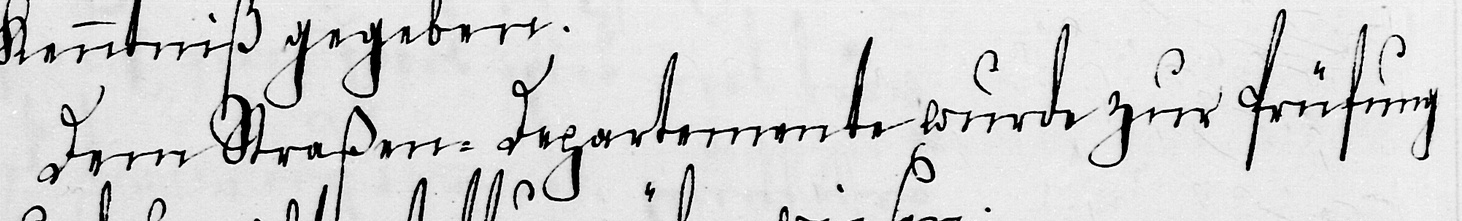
Dem Straßen-Departemente wurde zur Prüfung
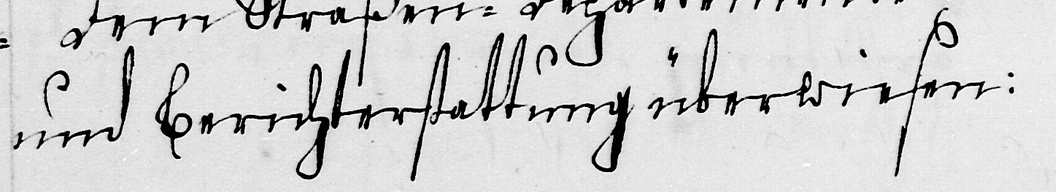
und Berichterstattung überwiesen:
